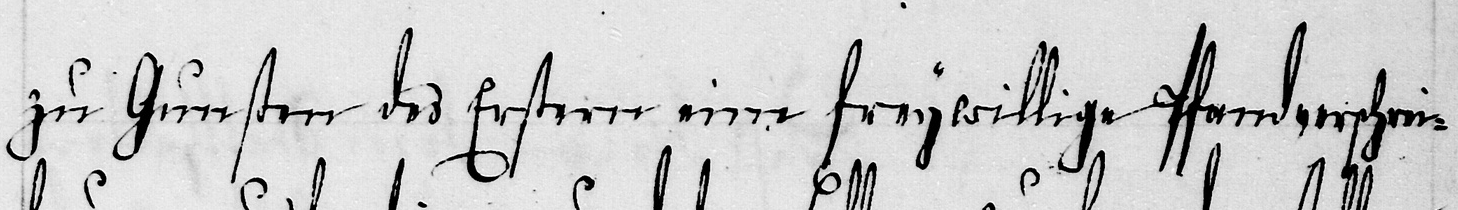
zu Gunsten des Erstern eine freywillige Pfandverschre¬
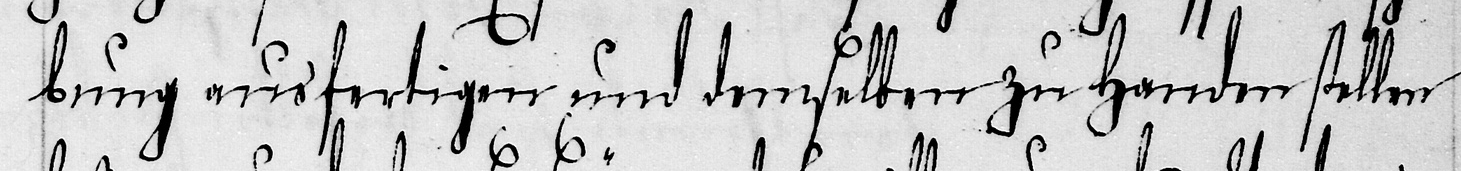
ibung ausfertigen und demselben zu Handen stellen
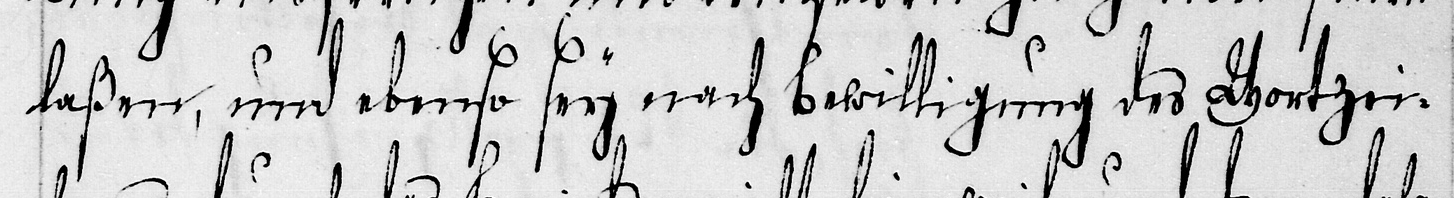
laßen, und ebenso sey nach Bewilligung des Wortzei¬
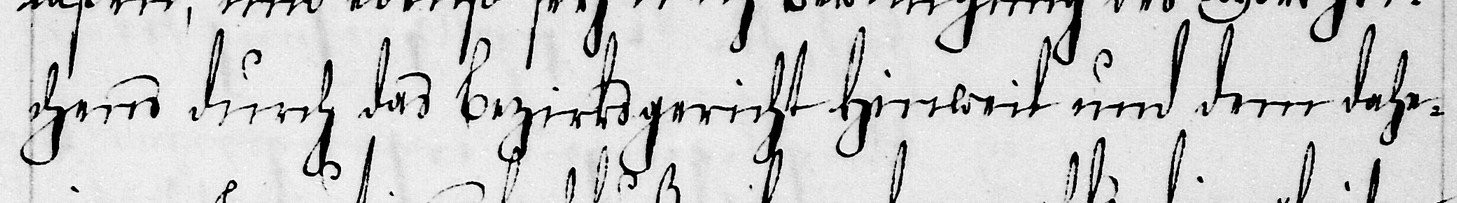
chens durch das Bezirksgericht Hinweil und dem dahe¬
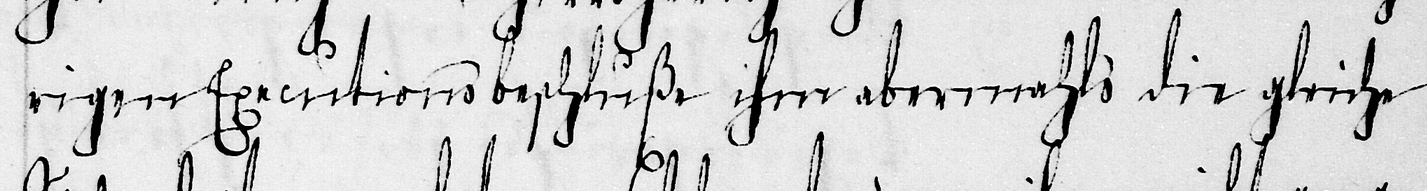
rigen Executionsbeschluße ihm abermahls die gleiche
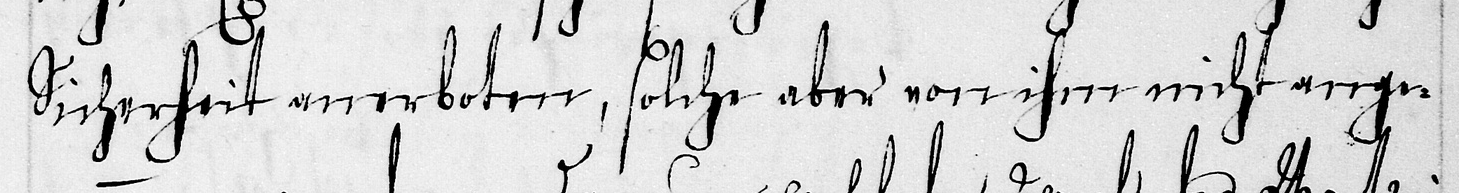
Sicherheit anerboten, solche aber von ihm nicht ange¬
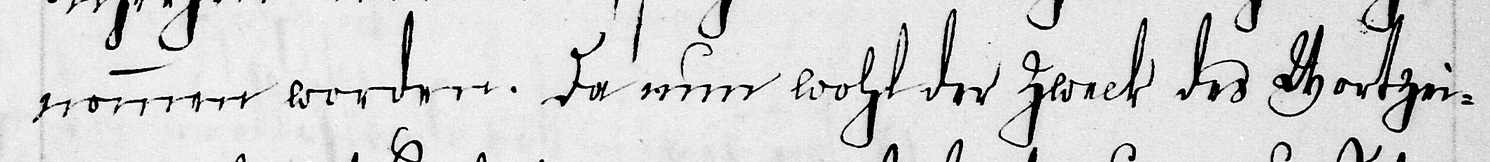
nommen worden. Da nun wohl der Zweck des Wortzei¬
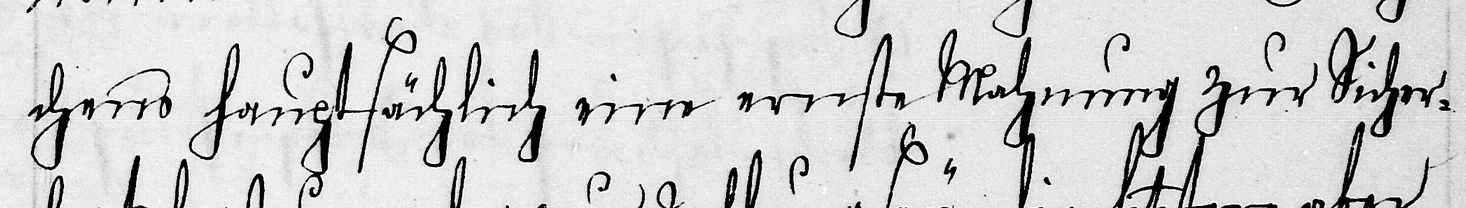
chens hauptsächlich eine ernste Mahnung zur Sicher¬
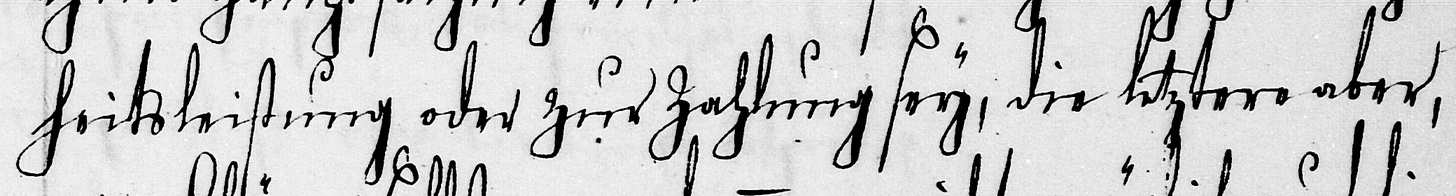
heitsleistung oder zu Zahlung sey, die letztere aber,
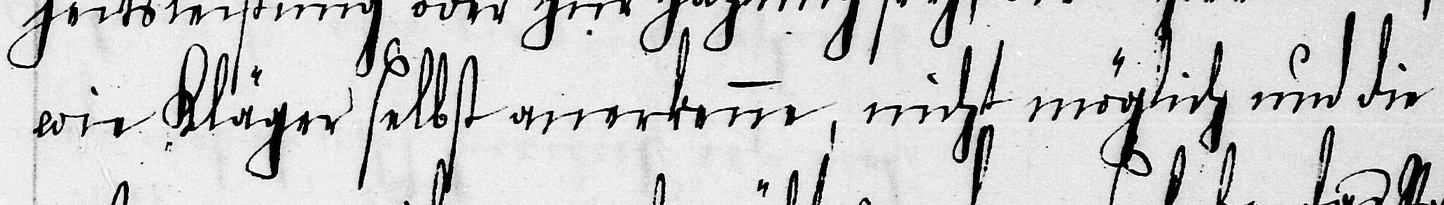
wie Kläger selbst anerkenne, nicht möglich und die
